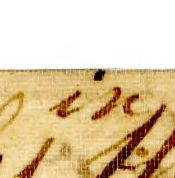in
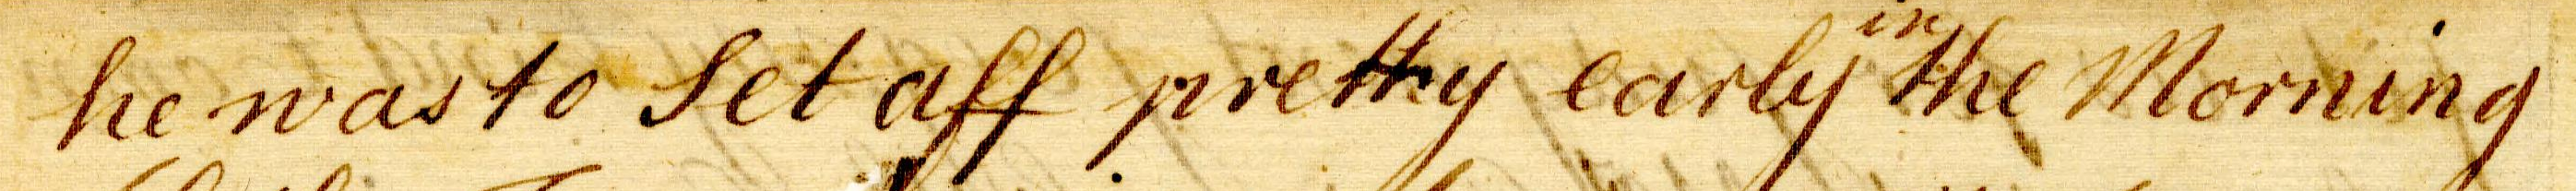he was to set off pretty early the Morning
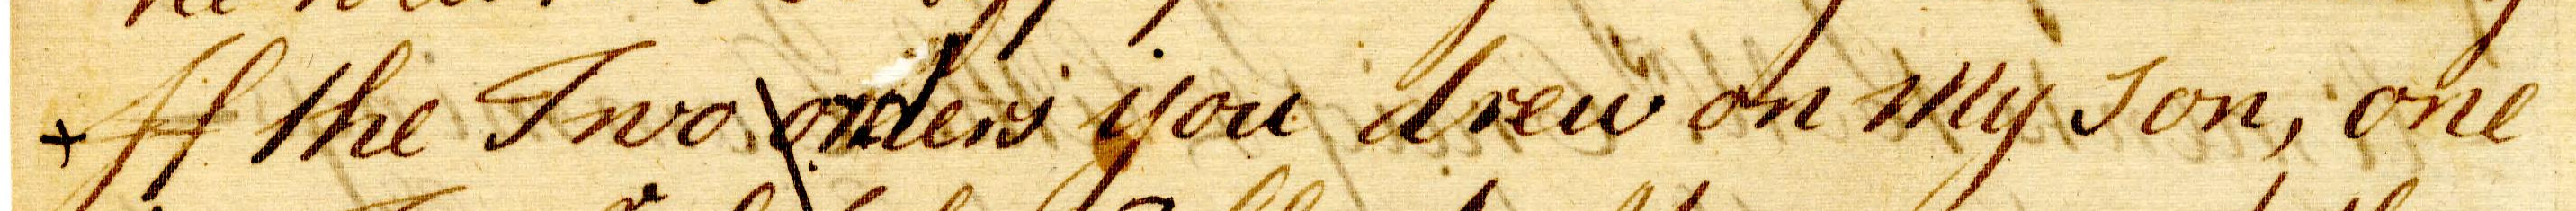If the Two orders you drew on My Son, one
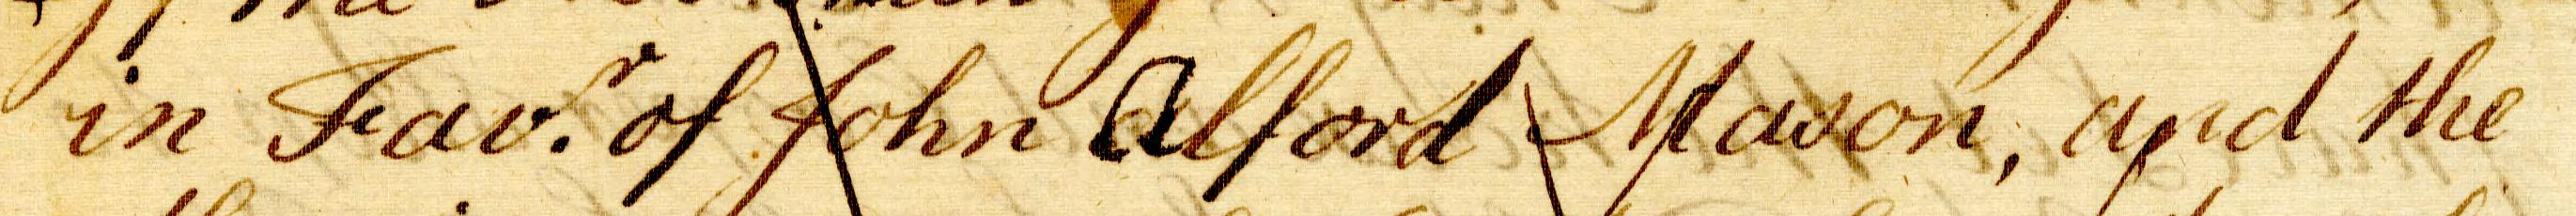in Fav^r. of John Alford Mason, and the
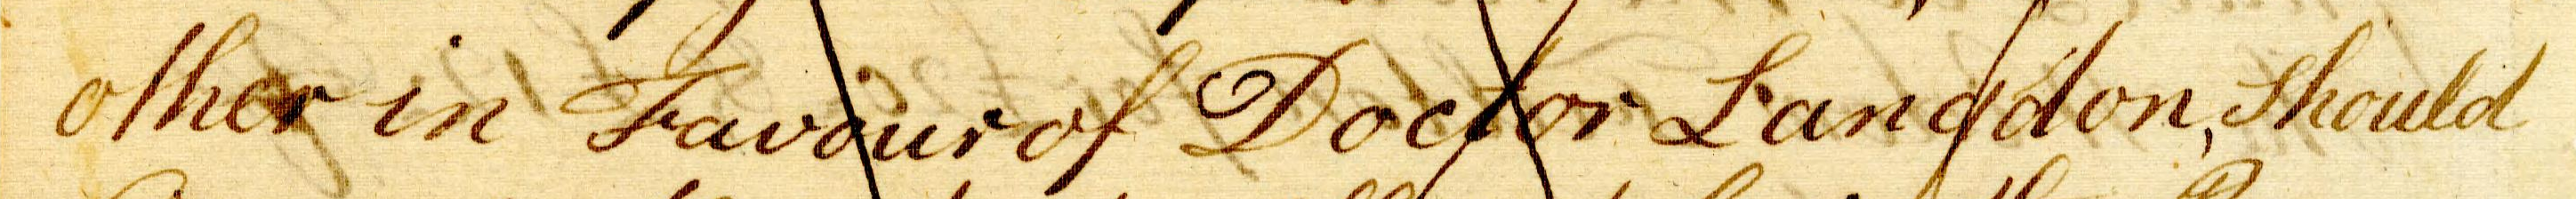other in Favour of Doctor Langdon, should
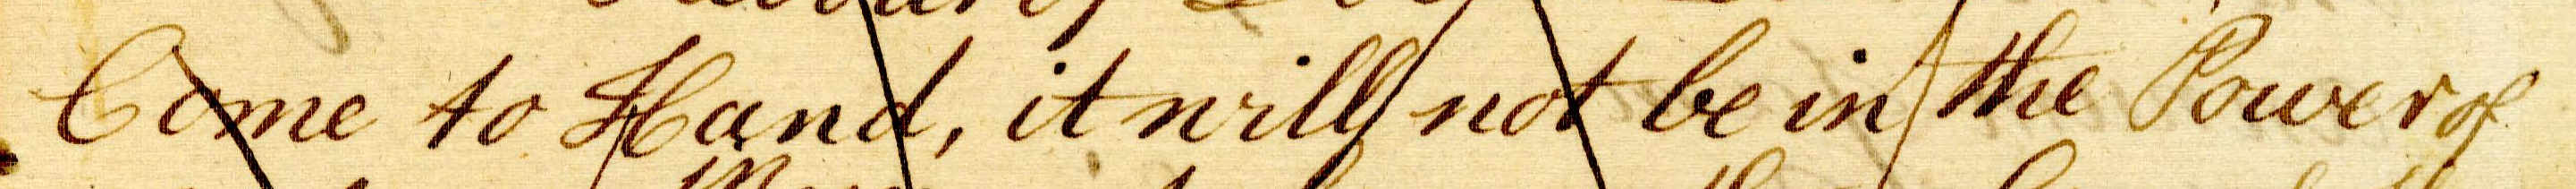Come to Hand, it will not be in the Power of
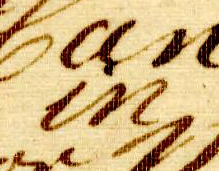in
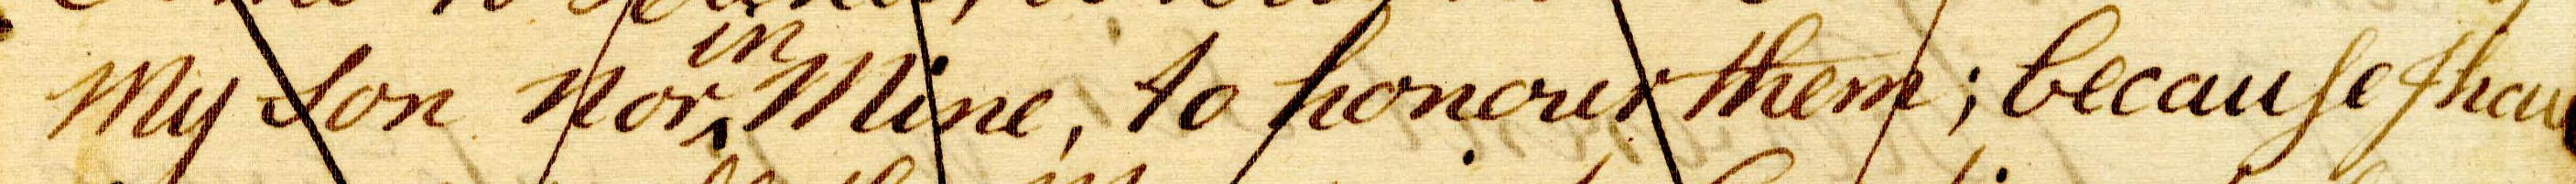My Son, Nor ^ Mine, to honour them; because I have
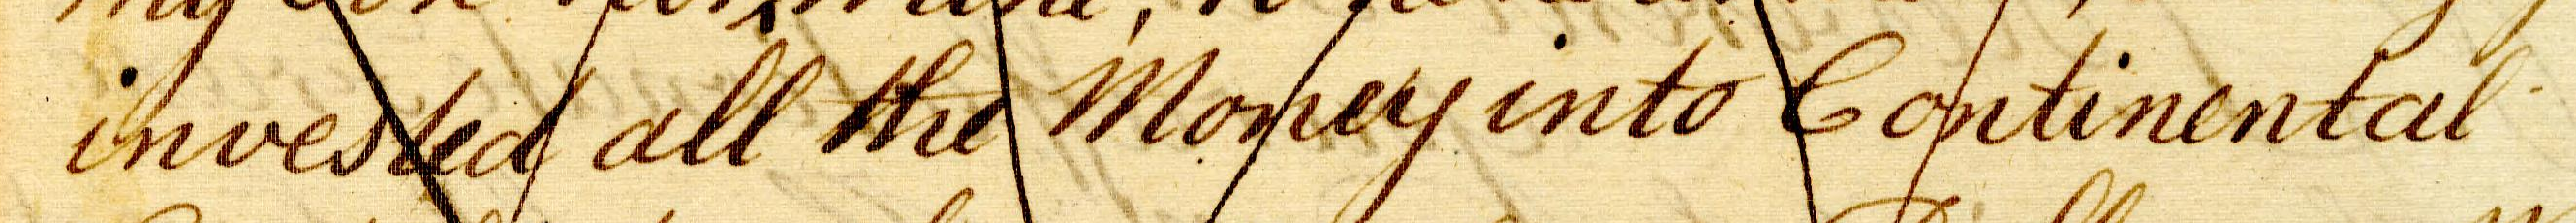invested all the Money into Continental
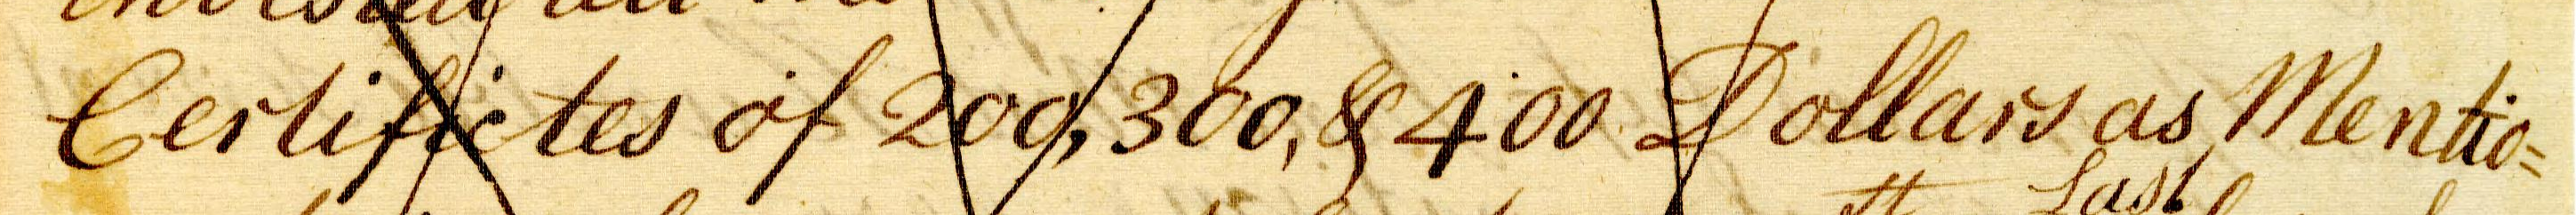Certificates of 200, 300, & 400 Dollars as Mentio-
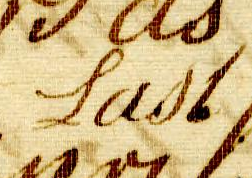Last
